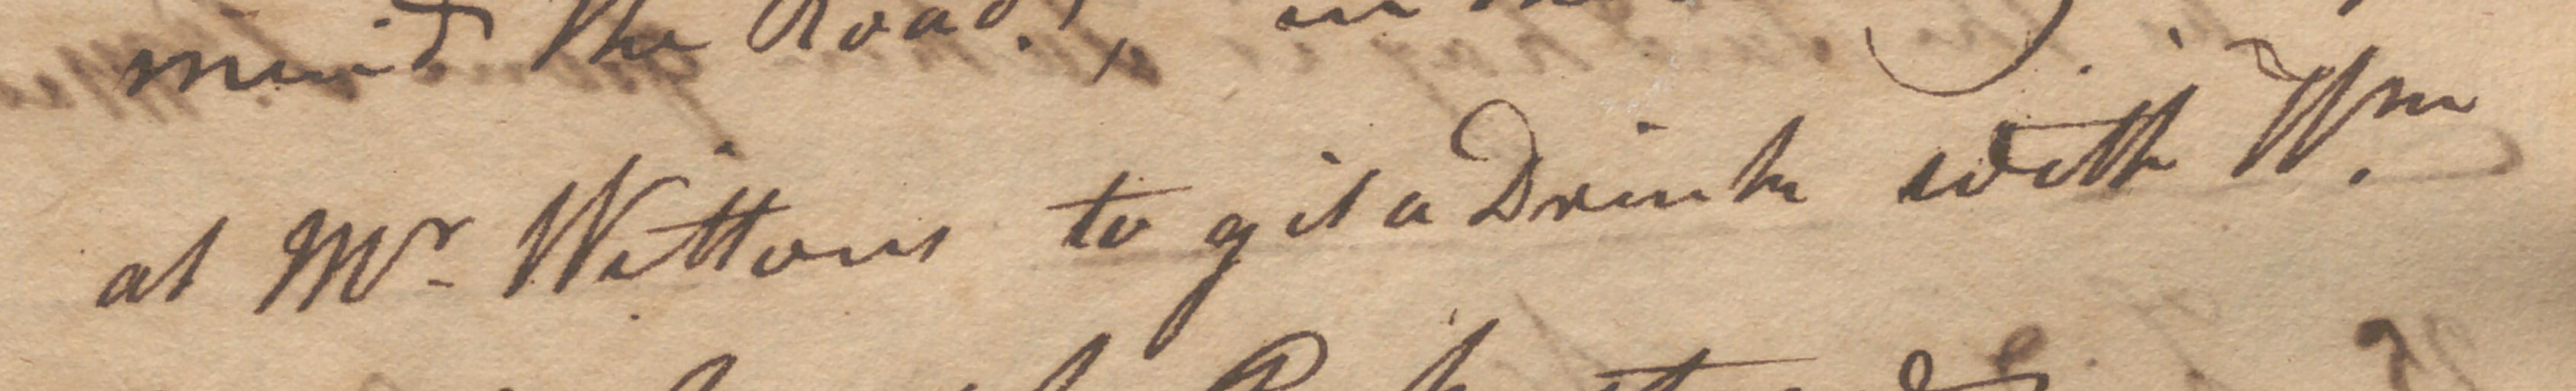at M^r. Wittons to git a Drink with W^m.
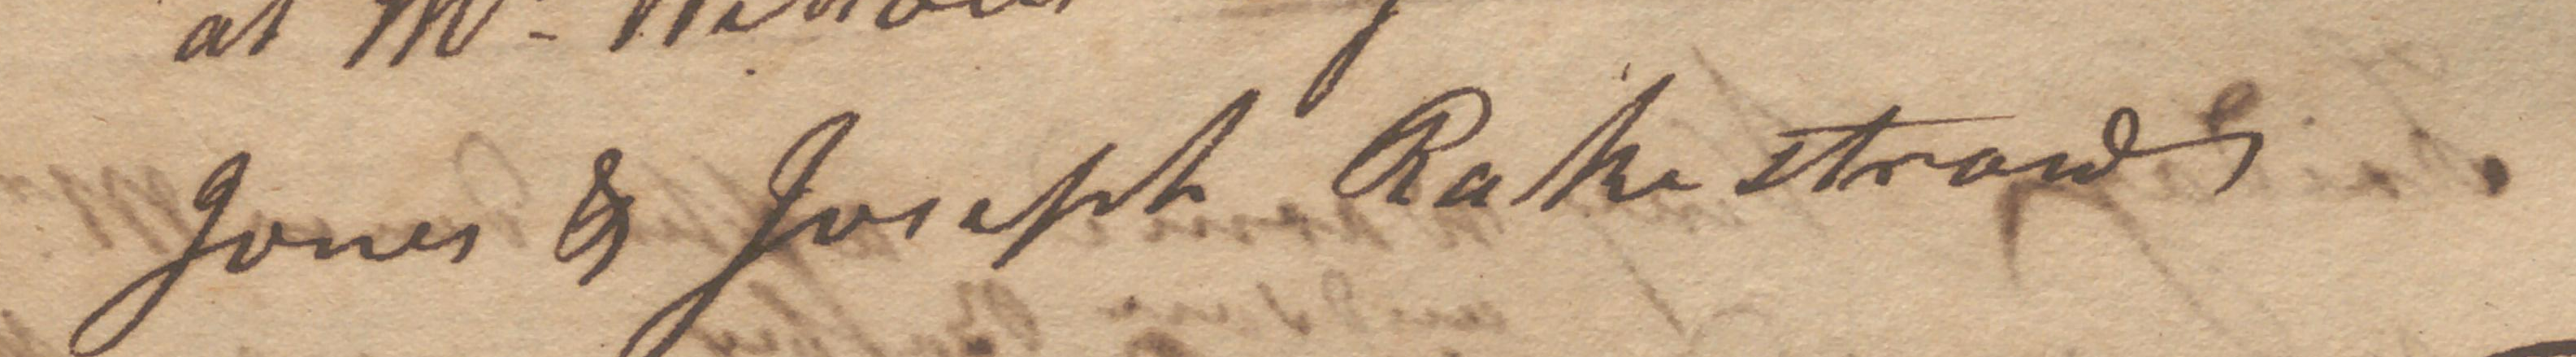Jones & Joseph Rake straws
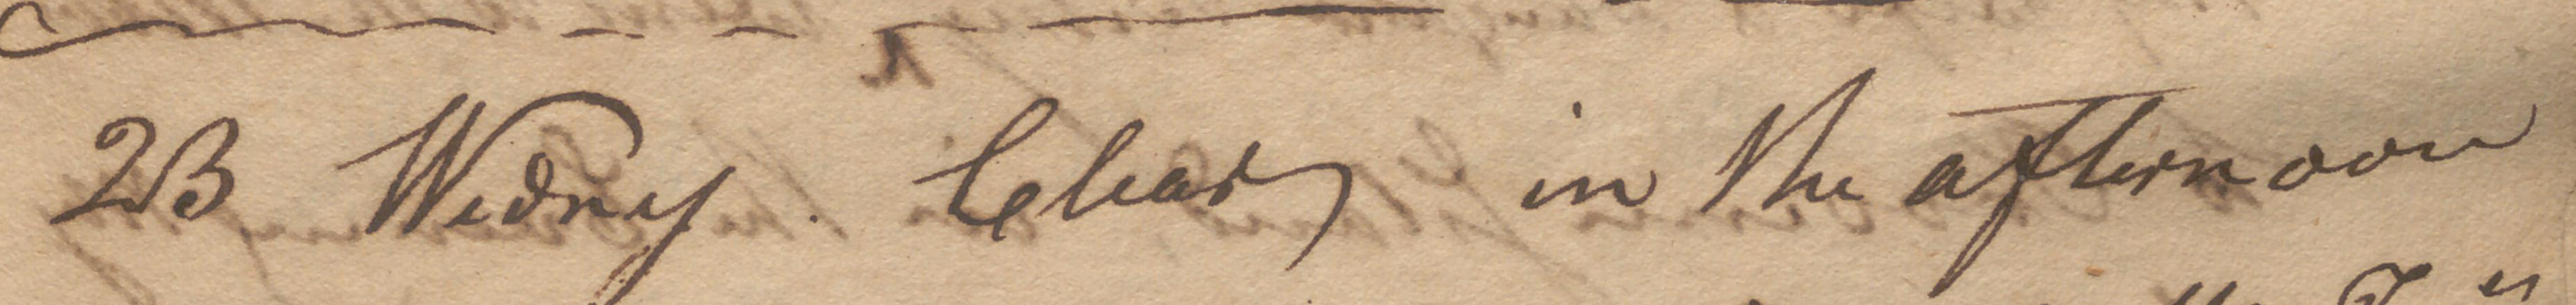23 Wednes. Clear in the afternoon
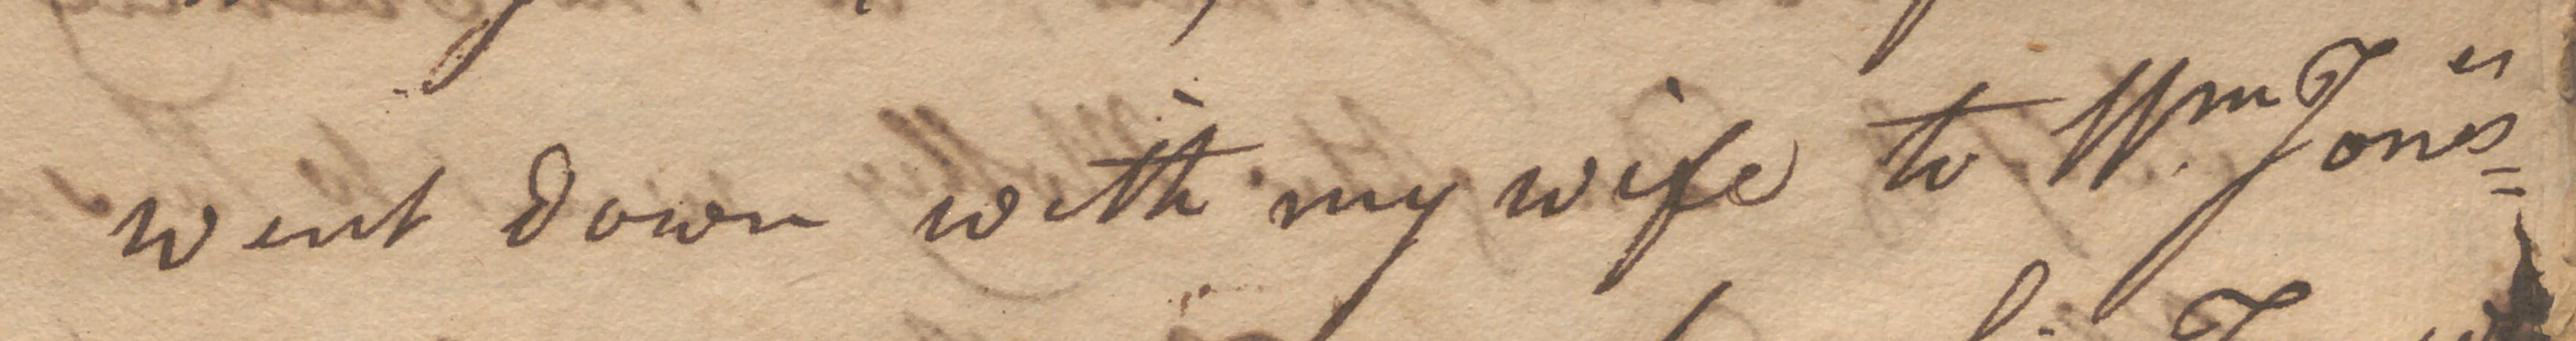went down with my wife to W^m. Jones^es
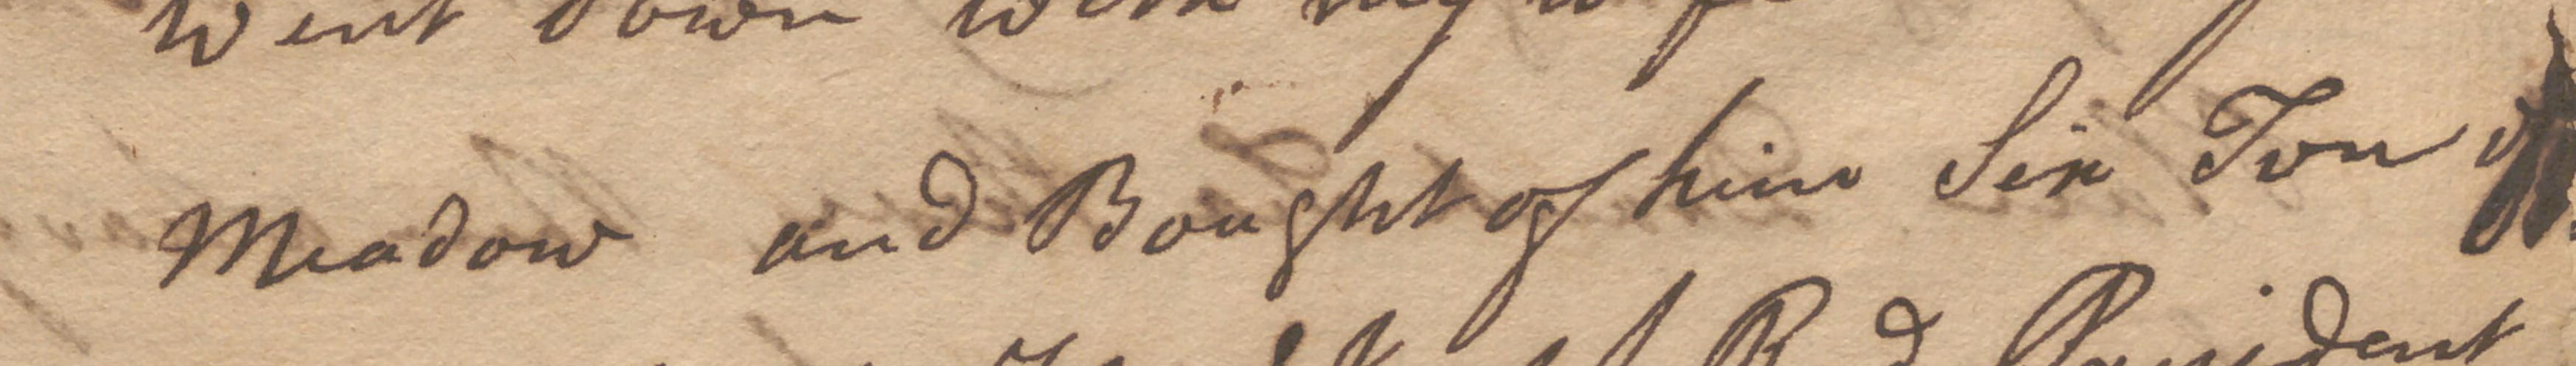Meadow and Bought of him Six Ton of
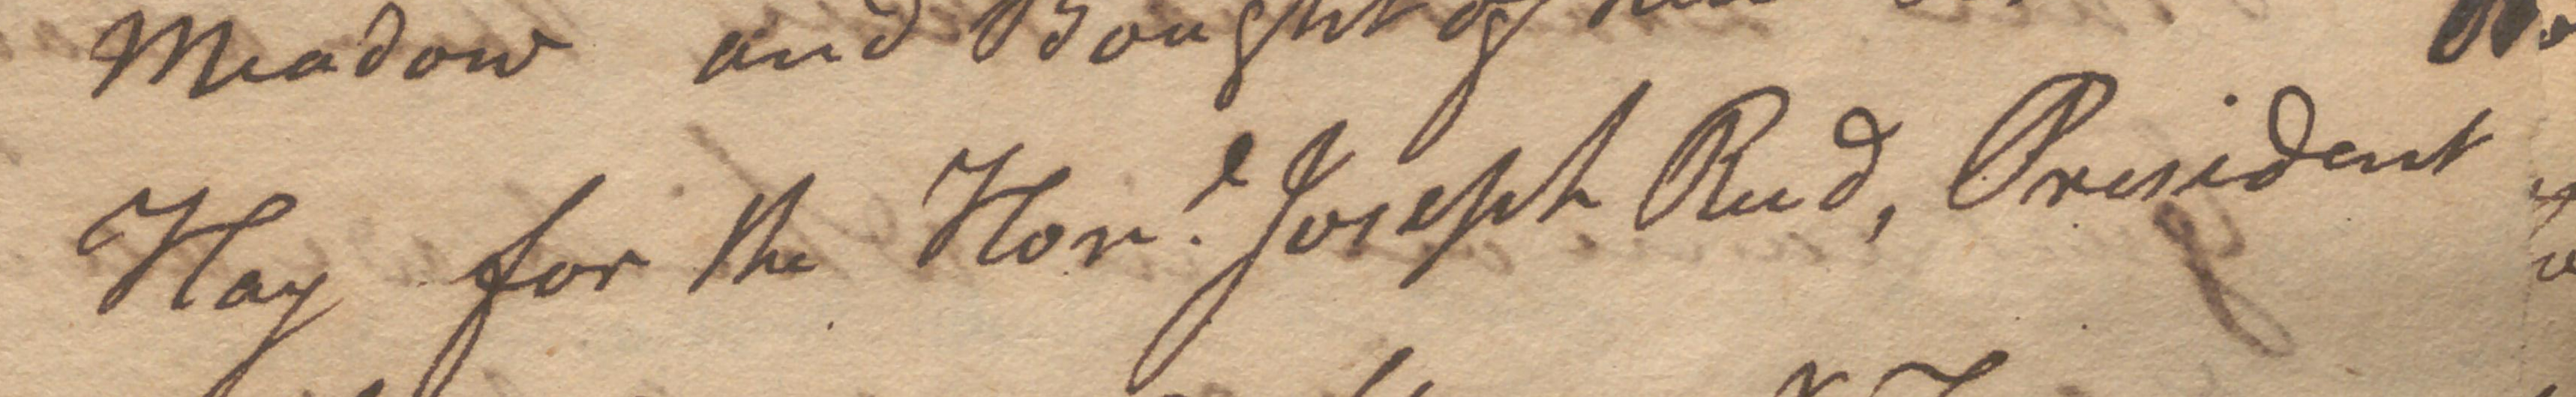Hay for the Hon^l. Joseph Reed, President
